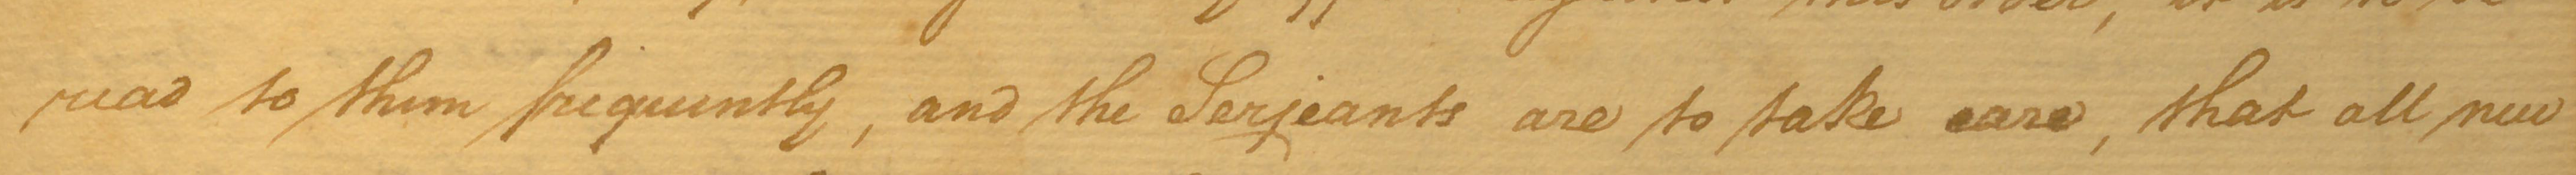read to them frequently, and the Serjeants are to take care, that all new
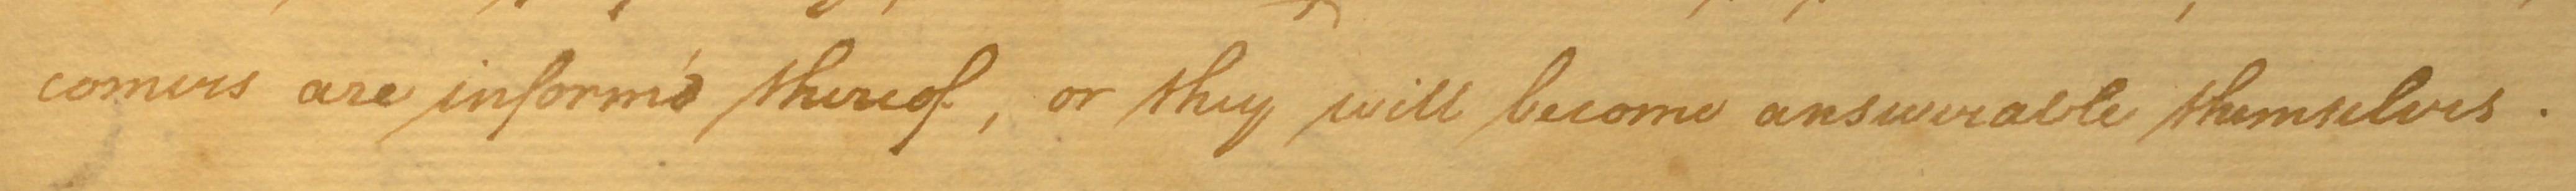comers are inform'd thereof, or they will become answerable themselves.
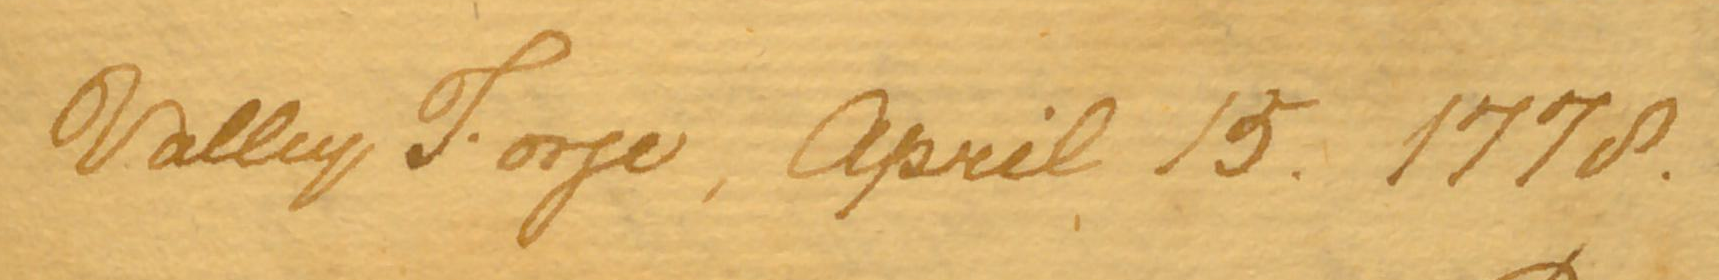Valley Forge, April 15. 1778.
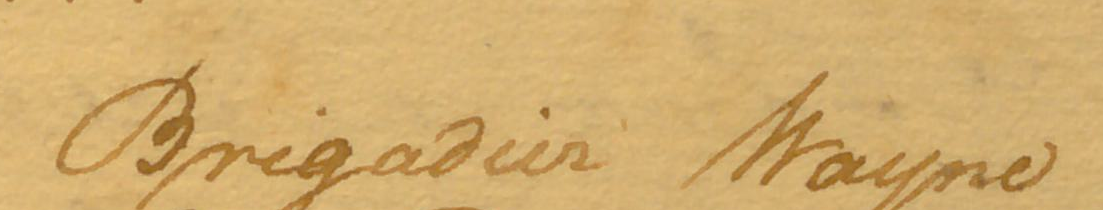Brigadier Wayne
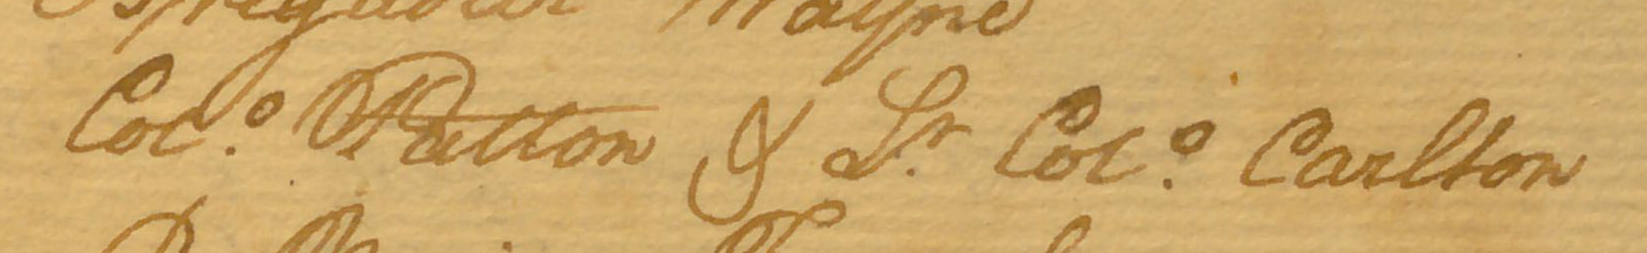Col^o. Patton & L^t. Col^o. Carlton
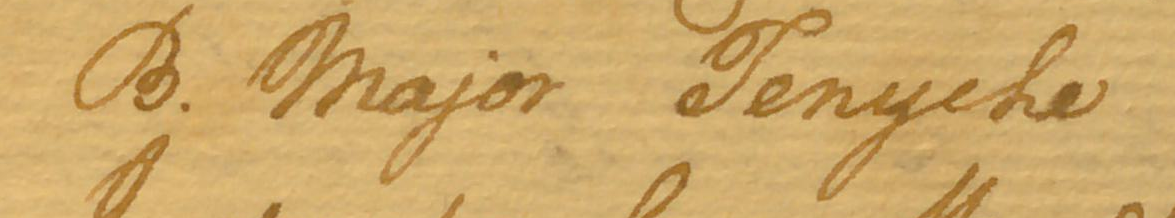B. Major Tenyche
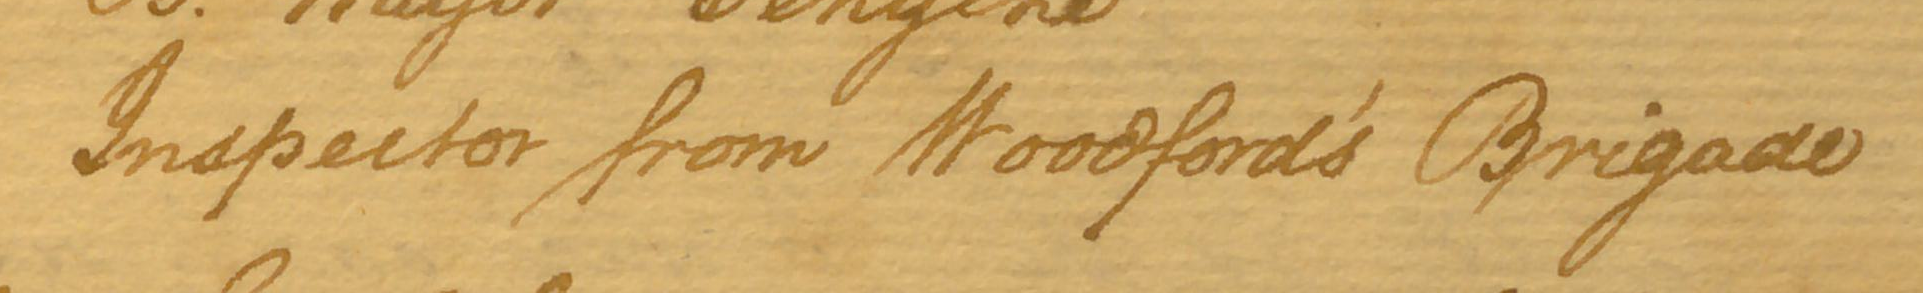Inspector from Woodford's Brigade
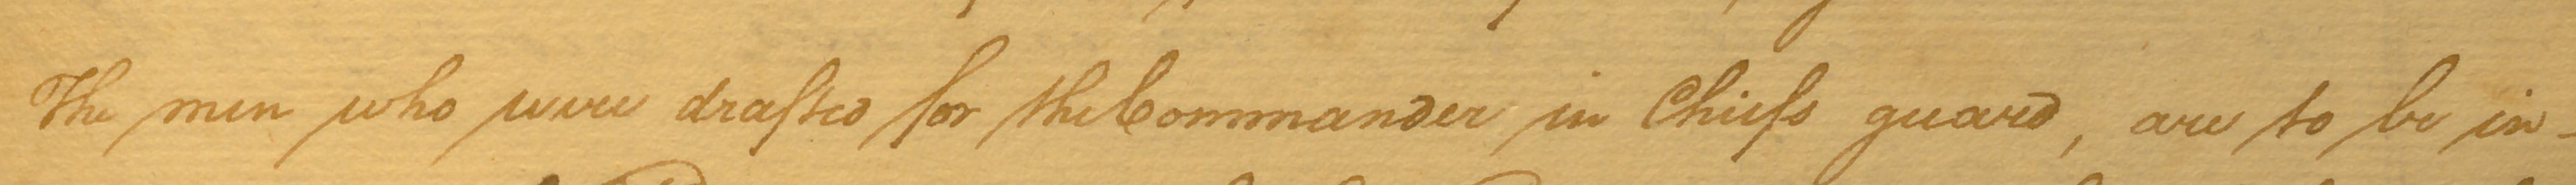The men who were drafted for the Commander in Chiefs guard, are to be in
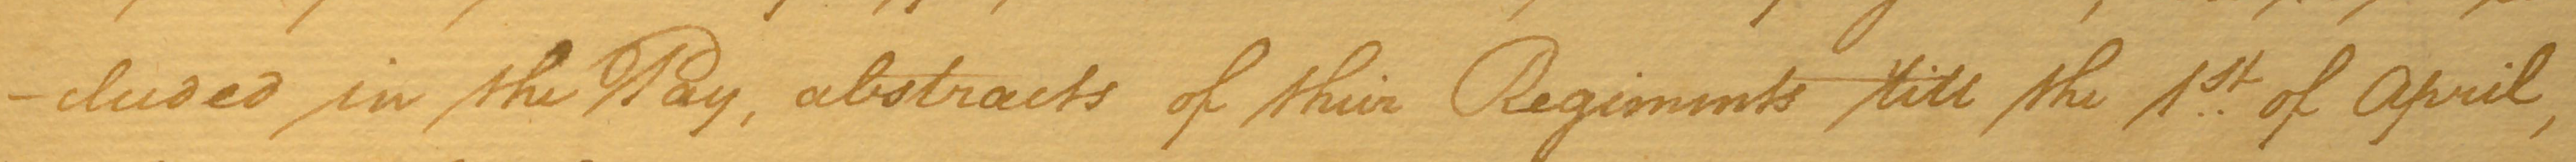-cluded in the Pay, abstracts of their Regiments till the 1^st. of April,
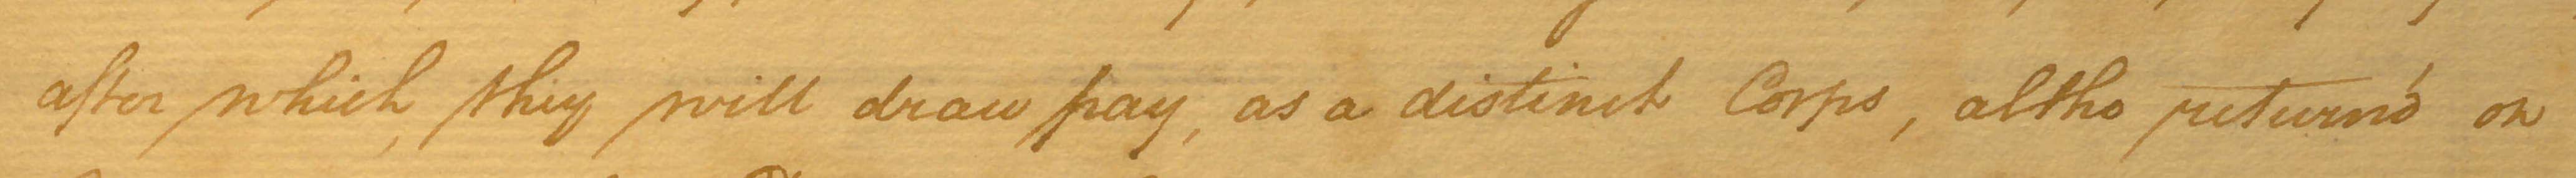after which they will draw pay, as a distinct Corps, altho return'd on
